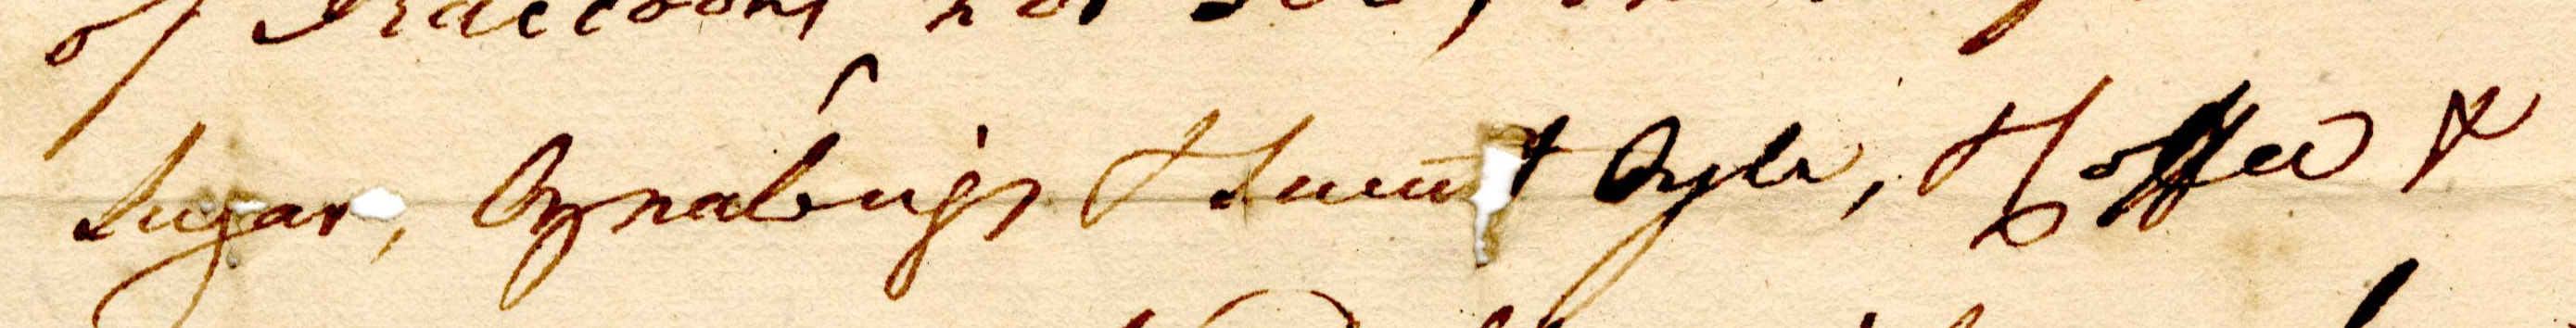Sugar, Oznabrigs & sweet oyle, & coffee &
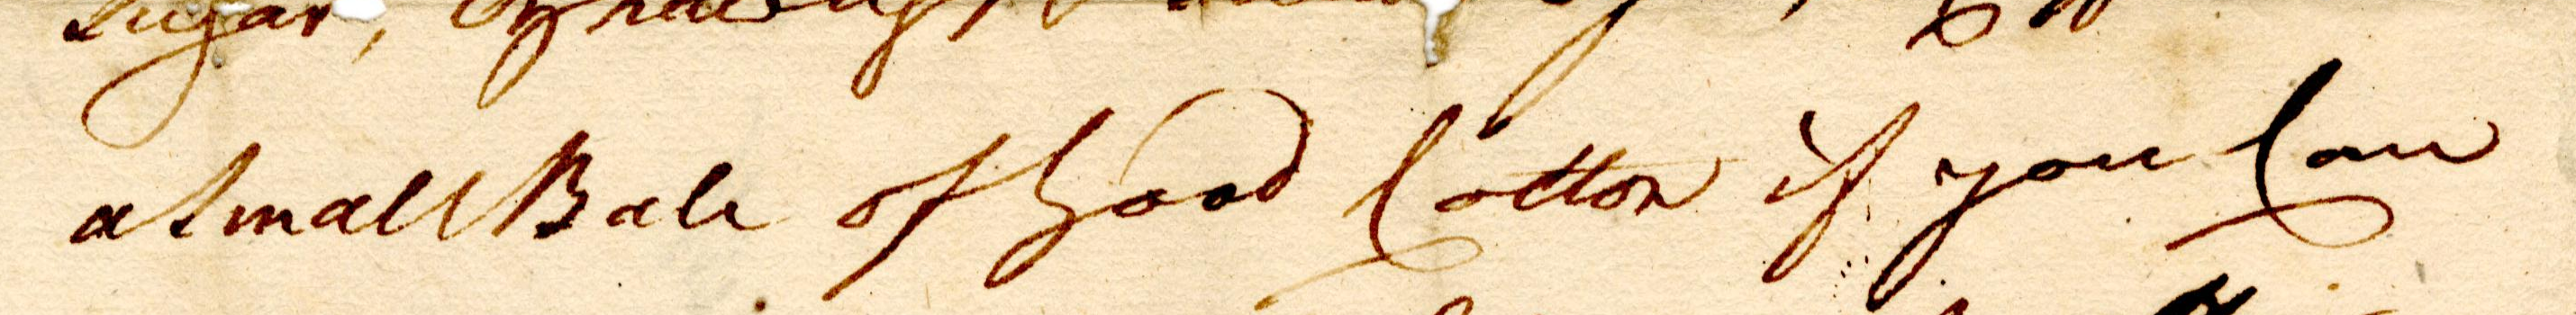a small bale of Good Cotton if you Can
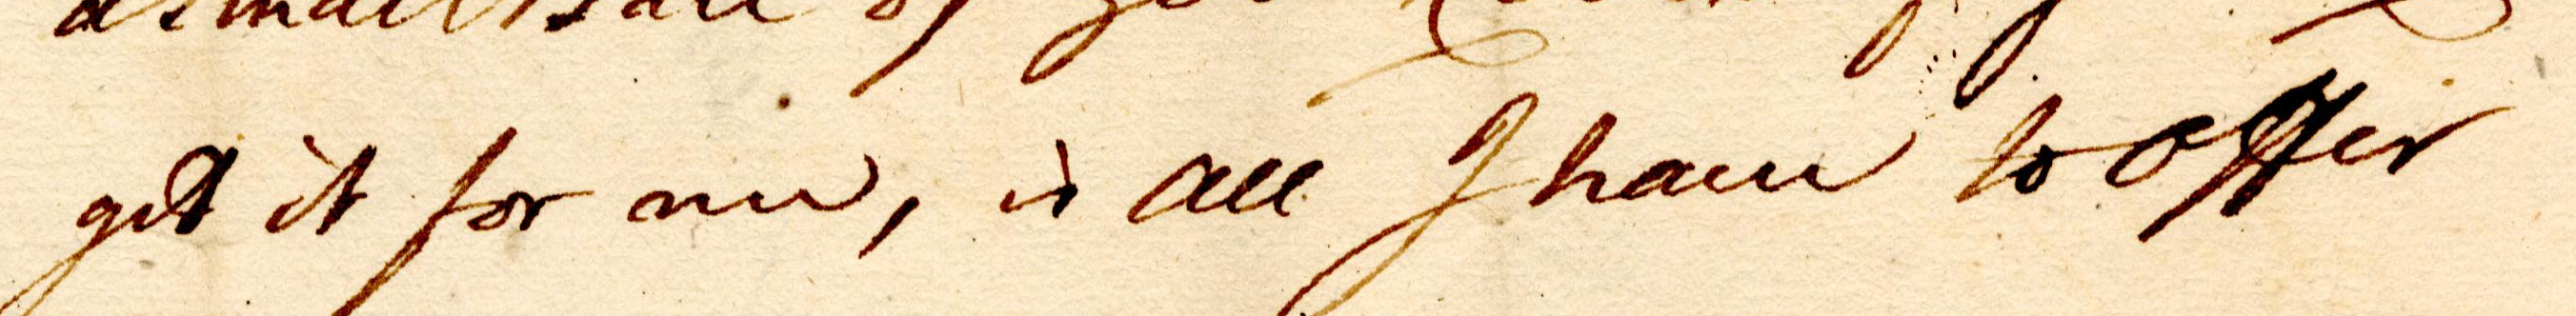get it for me, is all I have to offer
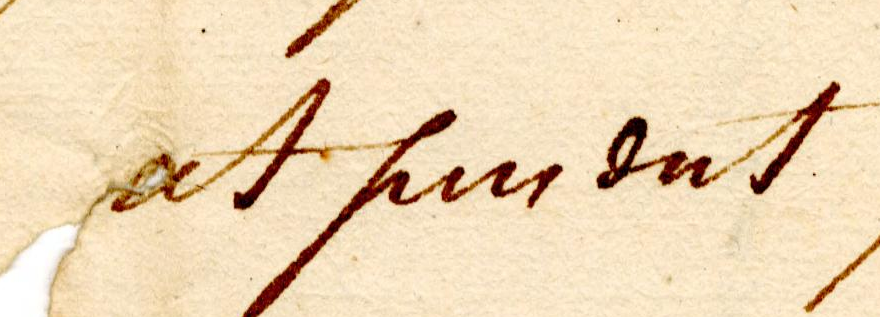at present
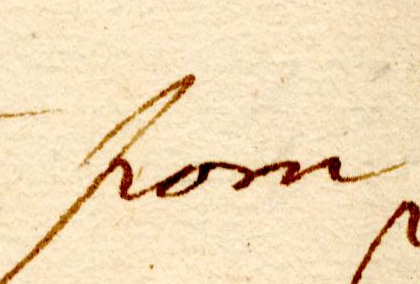From
